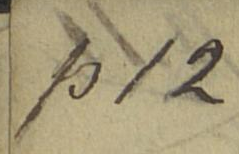p 12
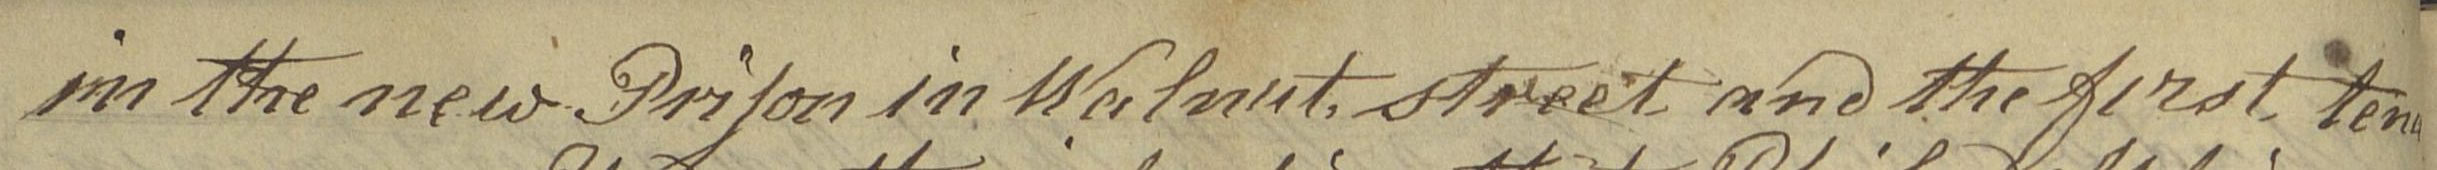in the new Prison in Walnut street and the first, ten-
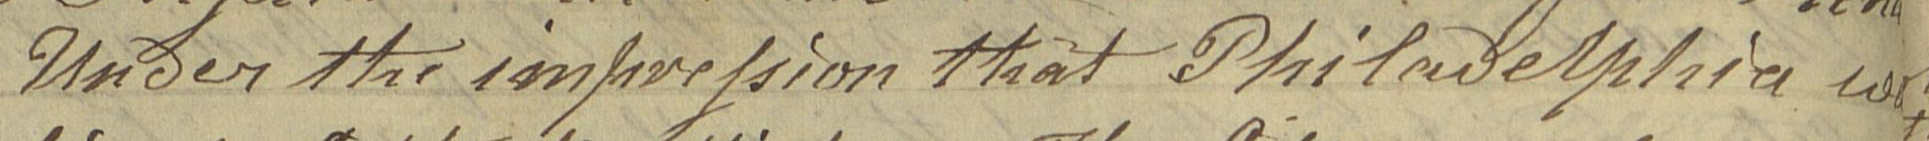Under the impression that Philadelphia wa
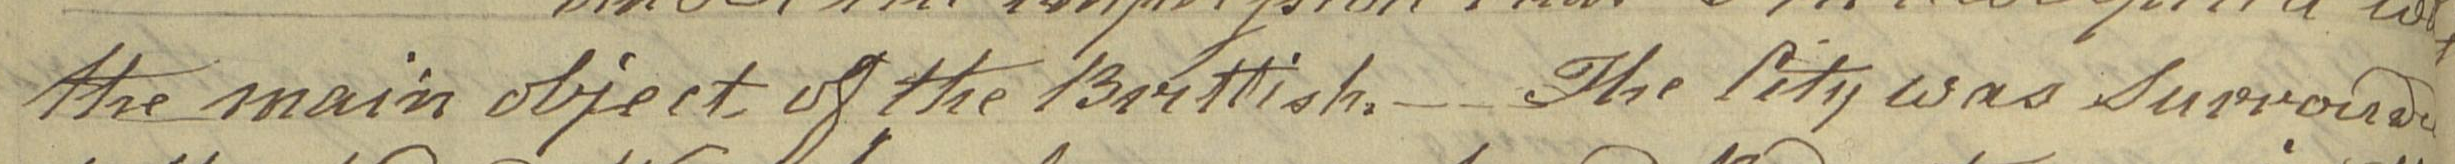the main object of the Brittish. The City was surrounded
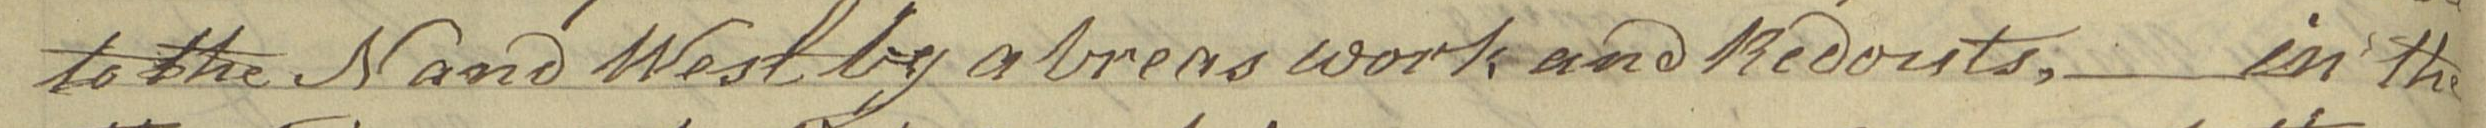to the N and West by a breas work and Redouts, in the
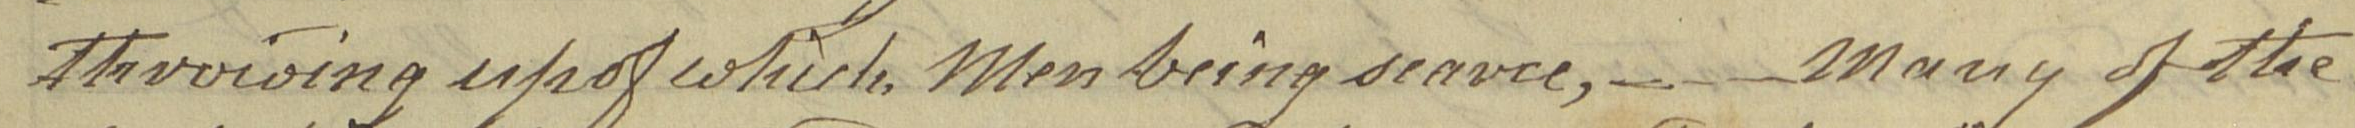throwing up of which men being seavce, Many of the
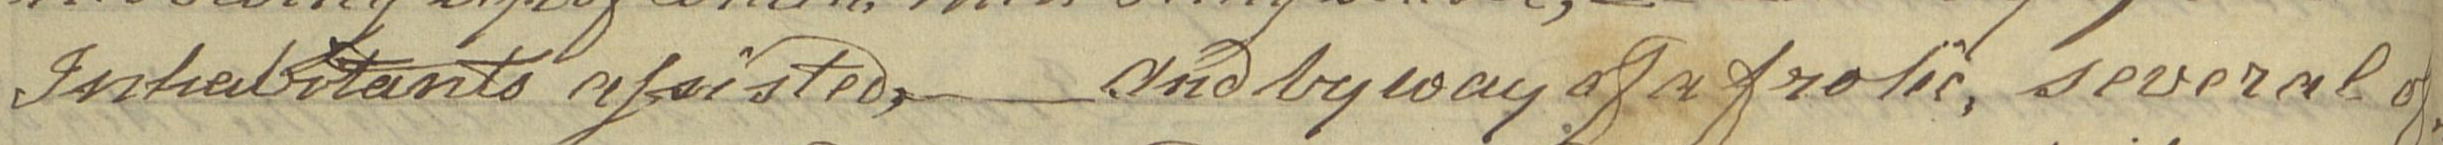Inhabitants assisted, And by way of a frolic, several of
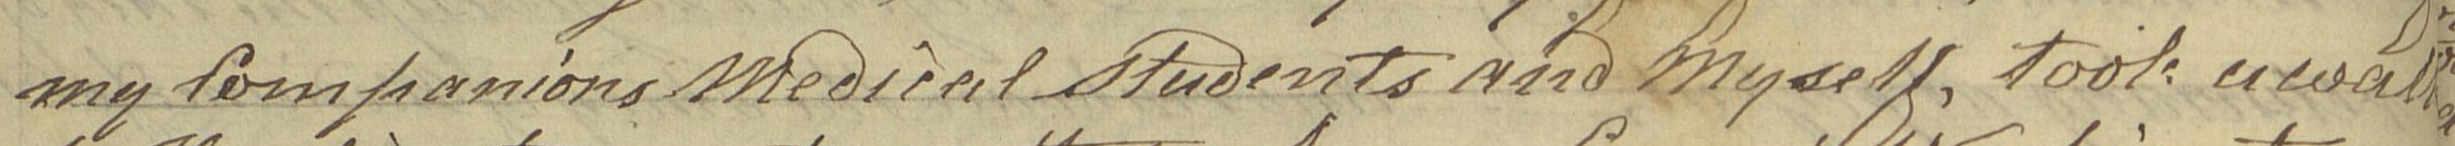my Companions Medical Students and Myself, took a wal-
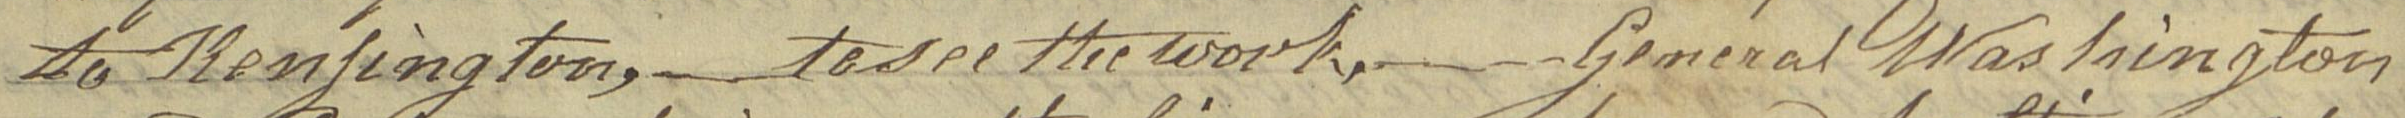to Kensington, to see the work, General Washington
